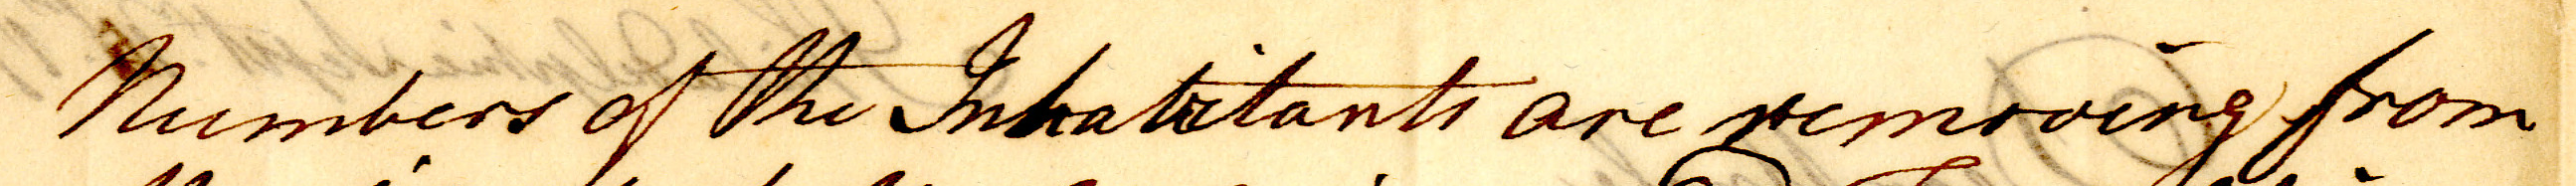Numbers of the Inhabitants are removing from
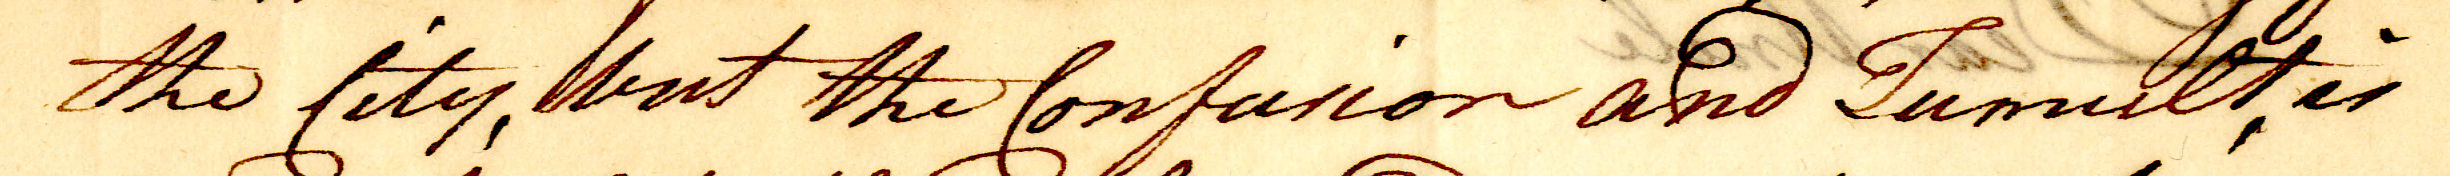the City, but the Confusion and Tumult is
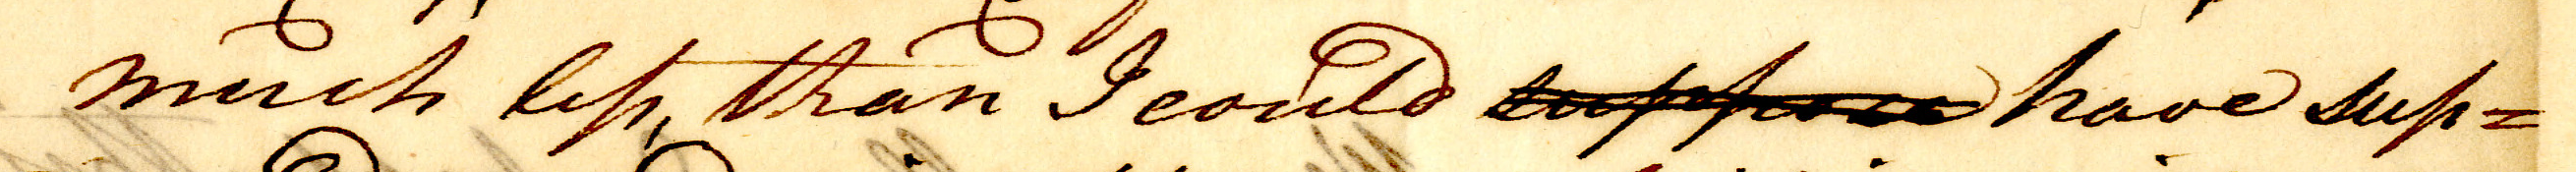much less, than I could [suppose] have sup-
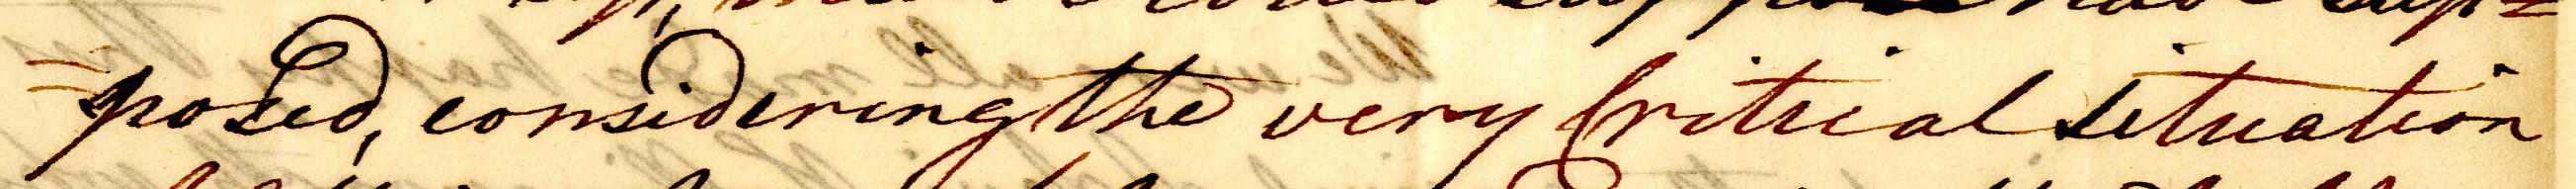-posed, considering the very Critical situation
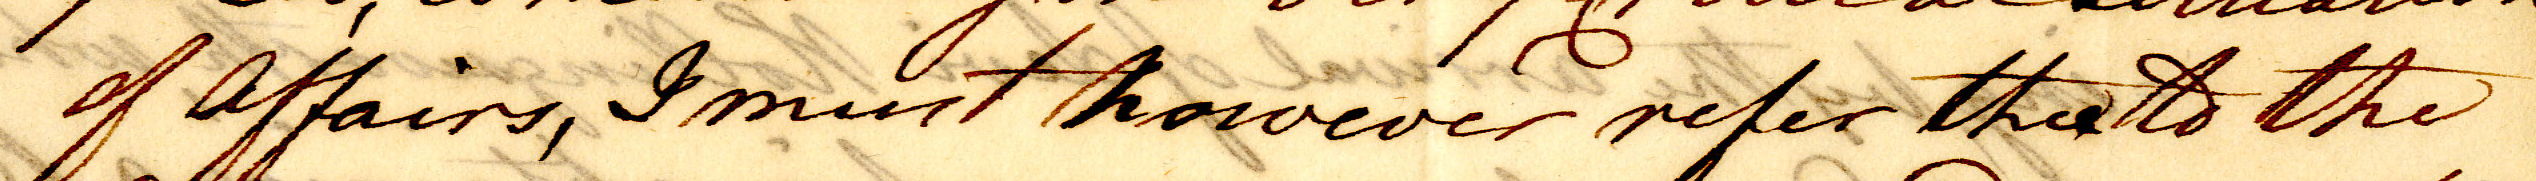of Affairs, I must however refer thee to the
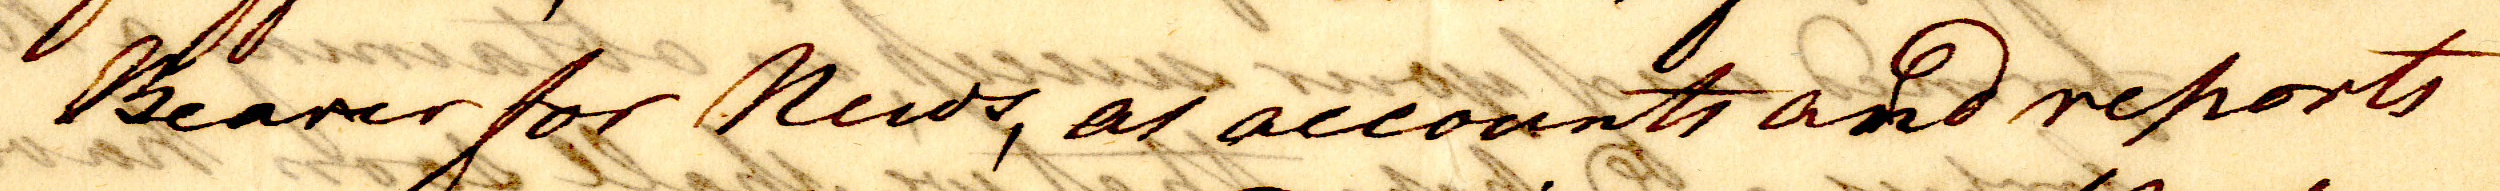Bearer for News, as accounts and reports
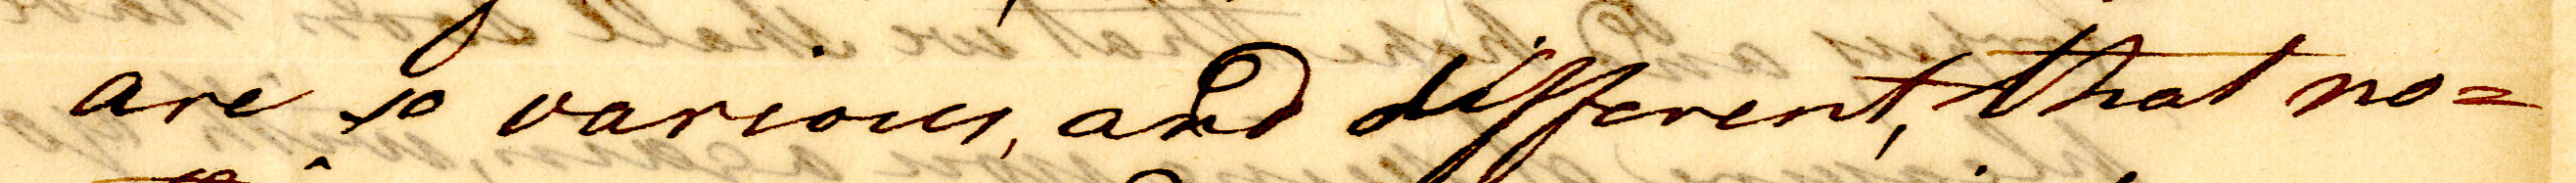are so various, and different, that no-
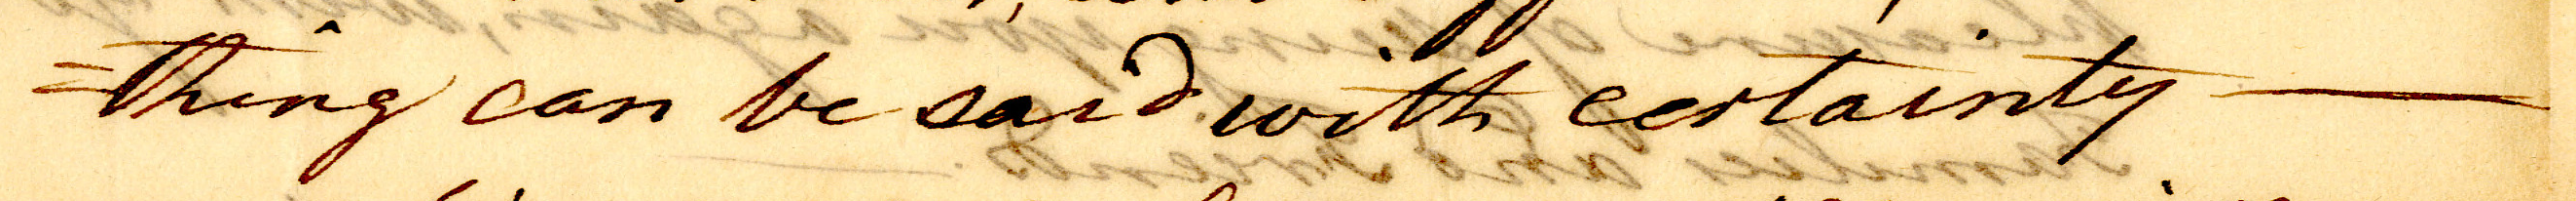-thing can be said with certainty-
